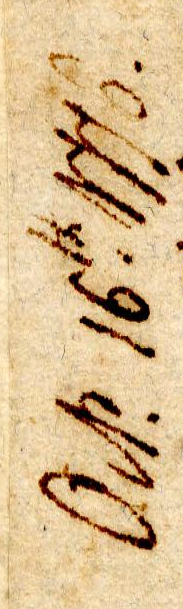Oct^r. 16^th. 1776.
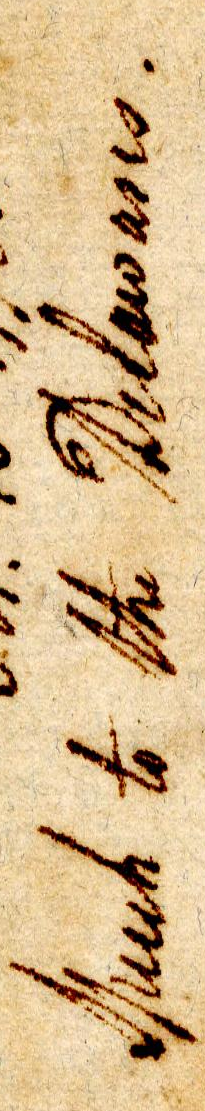Speech to the Delawares.
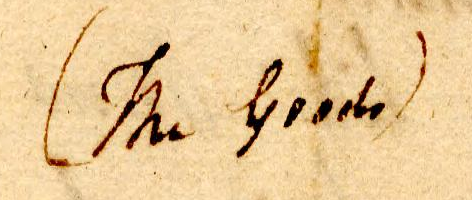(The Goods)
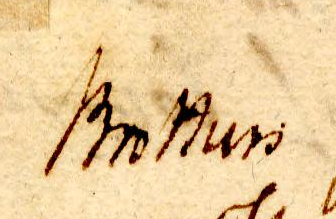Brothers
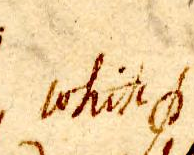white
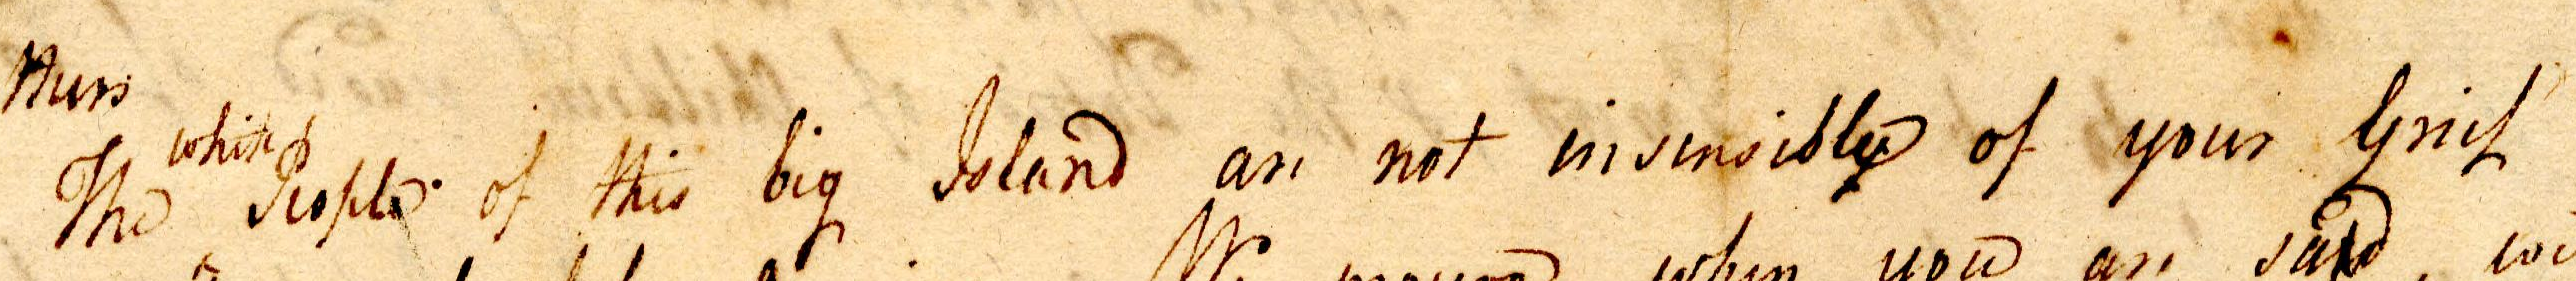The^ People of this big Island are not insensible of your Grief
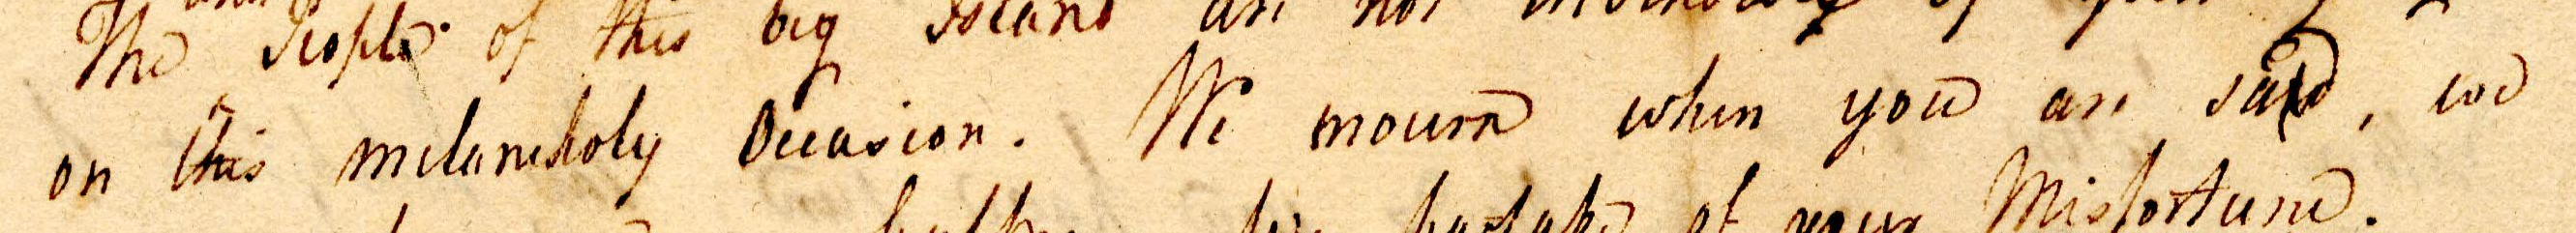on this melancholy Occasion. We mourn when you are sad, we
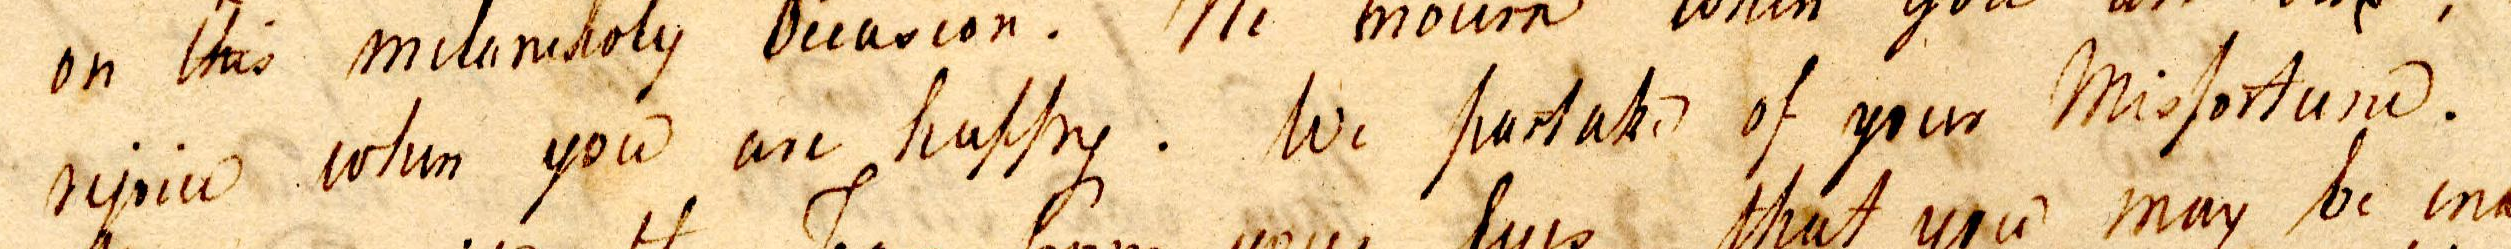rejoice when you are happy. We partake of your Misfortune.
